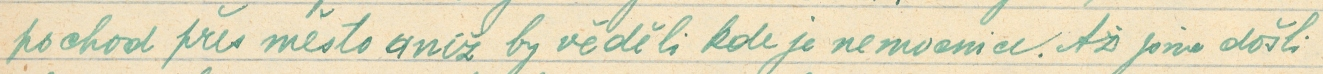pochod přes město aniž by věděli kde je nemocnice. Až jsme došli
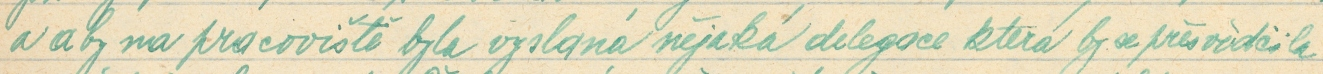a aby na pracoviště byla vyslaná nějaká delegace která by se přesvědčila
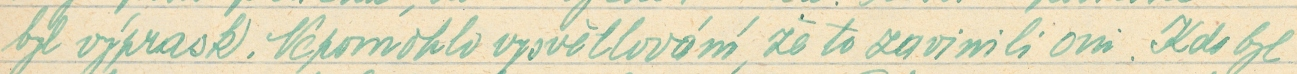byl výprask. Nepomohlo vysvětlování, že to zavinili oni. Kdo byl
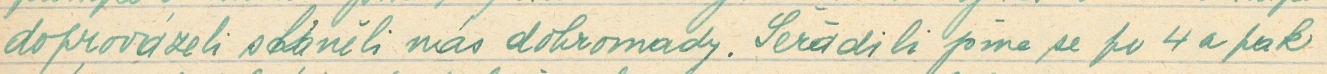doprovázeli sháněli nás dohromady. Seřadili jsme se po 4 a pak
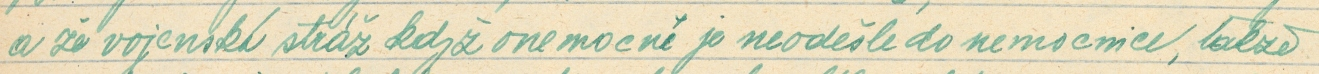a že vojenská stráž když onemocní je neodešle do nemocnice, takže
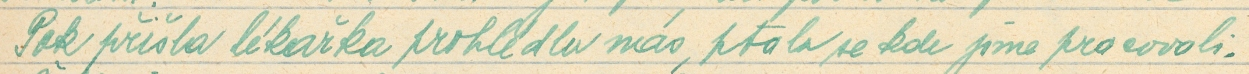Pak přišla lékařka prohlédla nás, ptala se kde jsme pracovali.
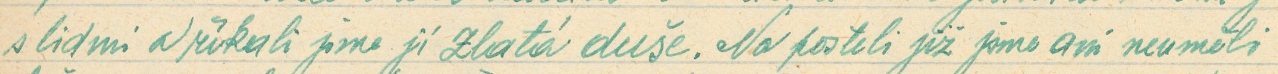s lidmi a říkali jsme jí zlatá duše. Na posteli již jsme ani neuměli
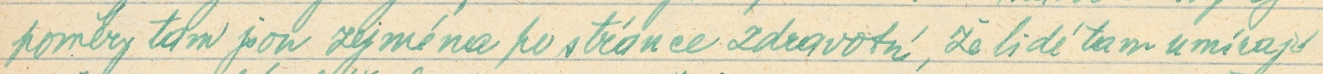poměry tam jsou zejména po stránce zdravotní, že lidé tam umírají
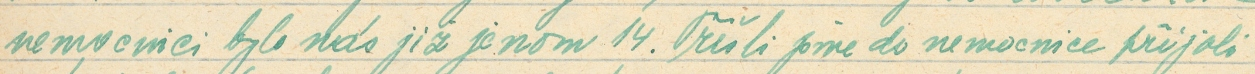nemocnici bylo nás již jenom 14. Přišli jsme do nemocnice přijali
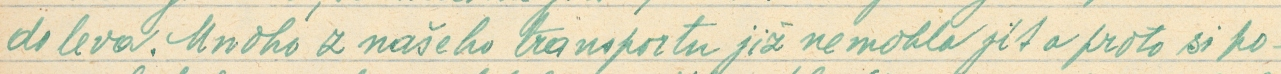do leva. Mnoho z našeho transportu již nemohlo jít a proto si po-
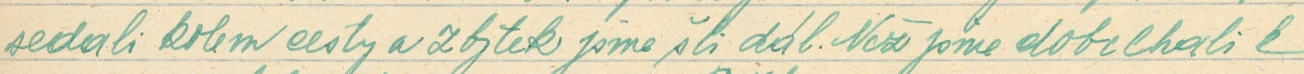sedali kolem cesty a zbytek jsme šli dál. Než jsme dobelhali k
